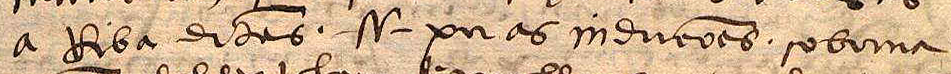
aRiba ditas. .ss. por as induções. soborna
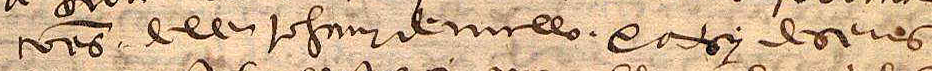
ções delle Joham de mello. e asy de seus
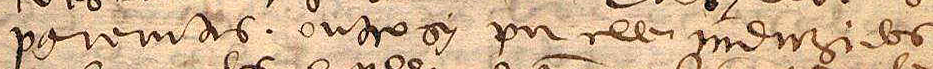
paremtes. outrosy por elle induzidos
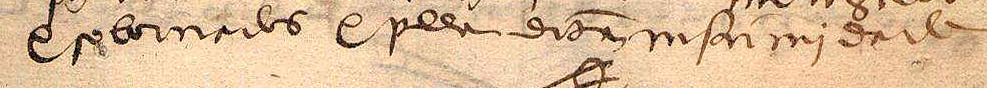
e sobornados e plla dit̄a infirmjdade
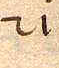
21
